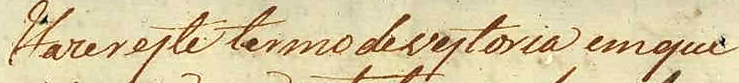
fazer este termo de vistoria em que
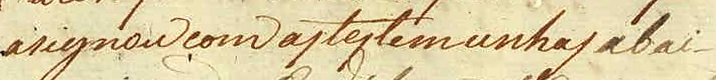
assignou com as testemunhas abai
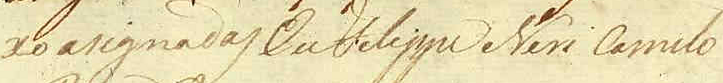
xo asignadas Eu Felippe Neri Camilo
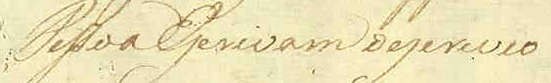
Pessoa Escrivam o escreveo
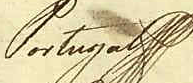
Portugal
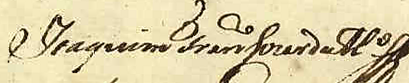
Ioaquim Fran.co Cezar de M.o
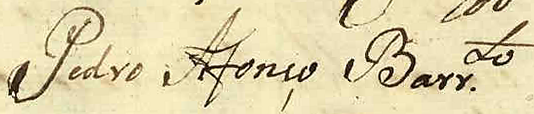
Pedro Afonço Barr.to
